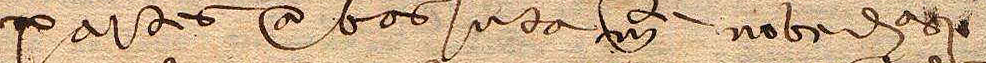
partes ābas Jūtamte nove djas
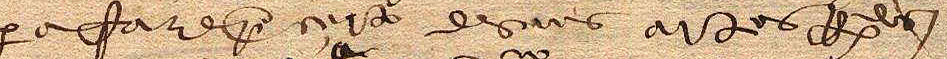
ꝑa fazerē çerto de seus artos Rꝭdos /
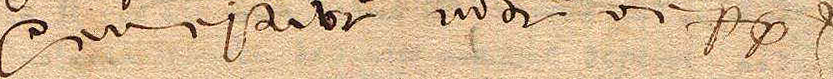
e eu ejtor vra notrro o estp̄
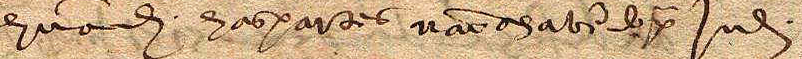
huā dja has partes não as aver̄do p̄ Judj.
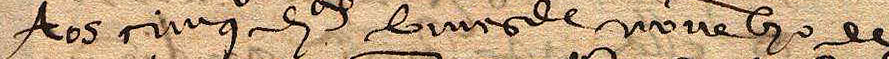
Aos çimqo djas do mes de noūebro de
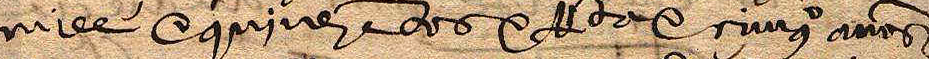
mill e qujnhētos e Rta e çimqo anōs
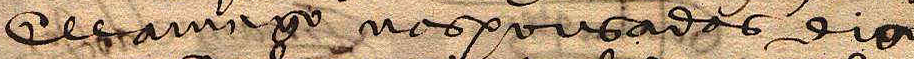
ē llamego nas pousadas digo
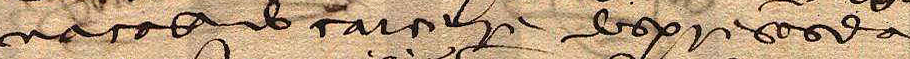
na casa do carçere dos presos da
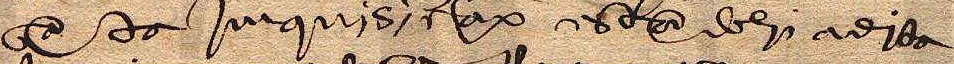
sāta Jmqujsjcão estādo hi a djta
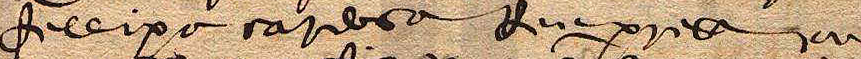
fellipa cardosa Ree presa eu
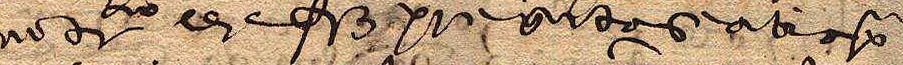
notrro lhe fjz preḡuta se avia p̄
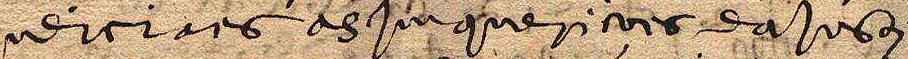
Judiciaes as Jmquerições da Justj
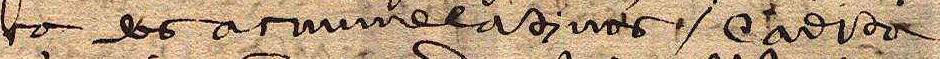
ça dos acumullatjuos / e a dita
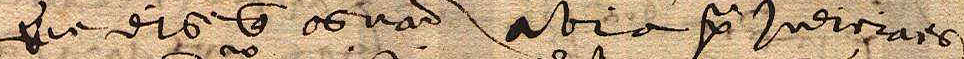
Ree dise q̄ as não avia p̄ Judiçiaes
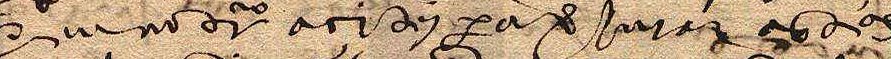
e eu notrro a çitej ꝑa ꝟ Jurar as tas
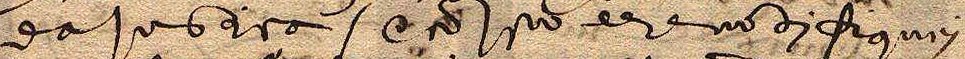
da Justiça / e cō Jso lhe notjfiquej
